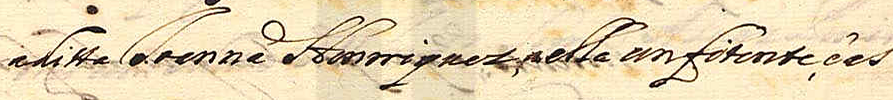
a ditta Ioanna Henrriquez, a ella confitente, e as
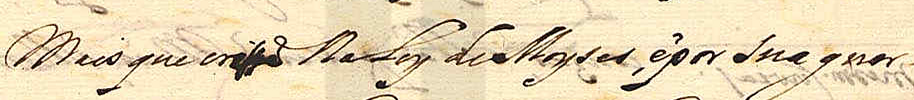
Mais que cri__ Na Ley de Moyses, e por sua guar
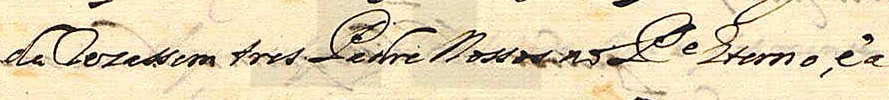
da Rezassem tres Padre Nossos ao Pe Eterno, e a
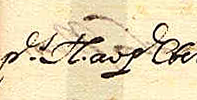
p.es N ao pe Eter.
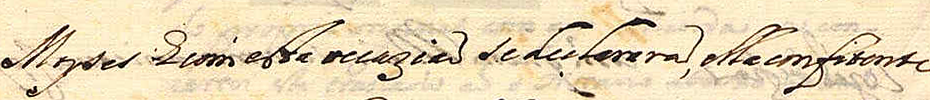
Moyses E com esta occaziaõ se declararā, ella confitente
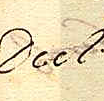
Decl.
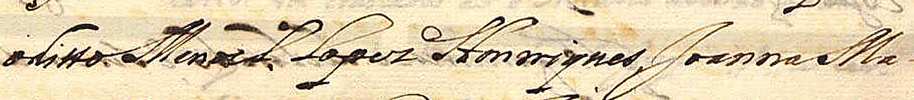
o ditto ManoeL Lopez Henrriques, Joanna Ma
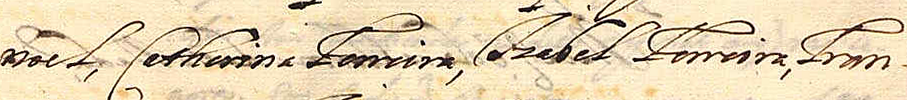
noeL, Cathrina Ferreira, Izabel Ferreira, Fran
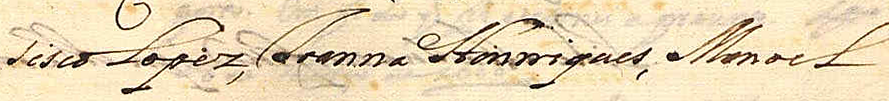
cisco Lopez, Ioanna Henrriques, ManoeL
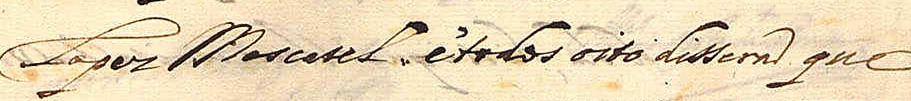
Lopez MoscateL e todos outro disserā que
